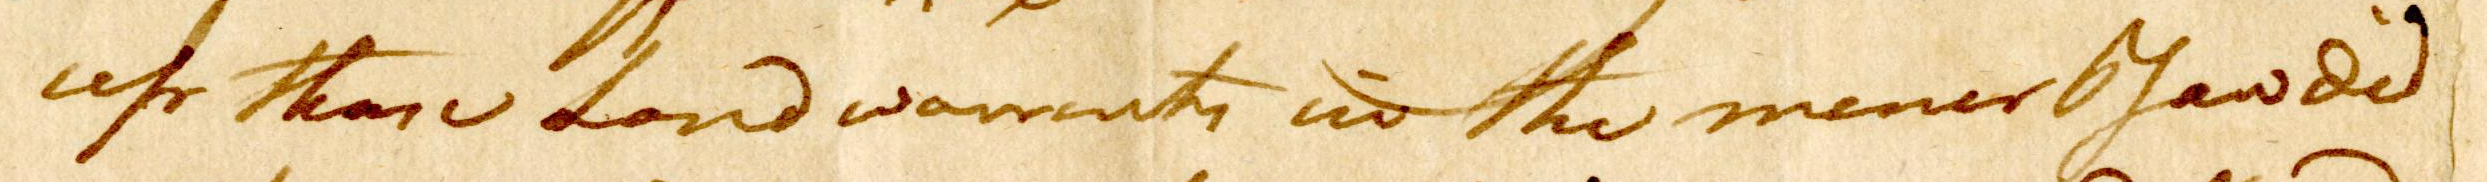up those Land warrants in the maner you did
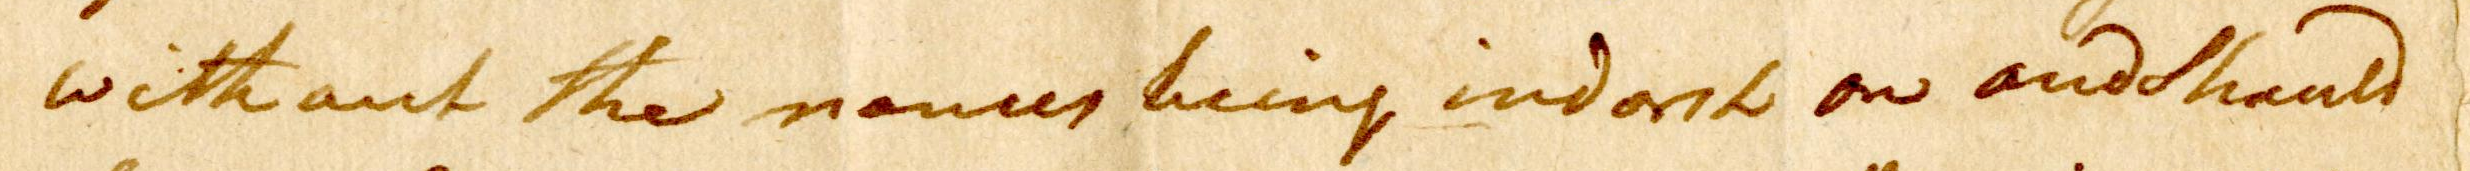without the nawees being in dark on and should
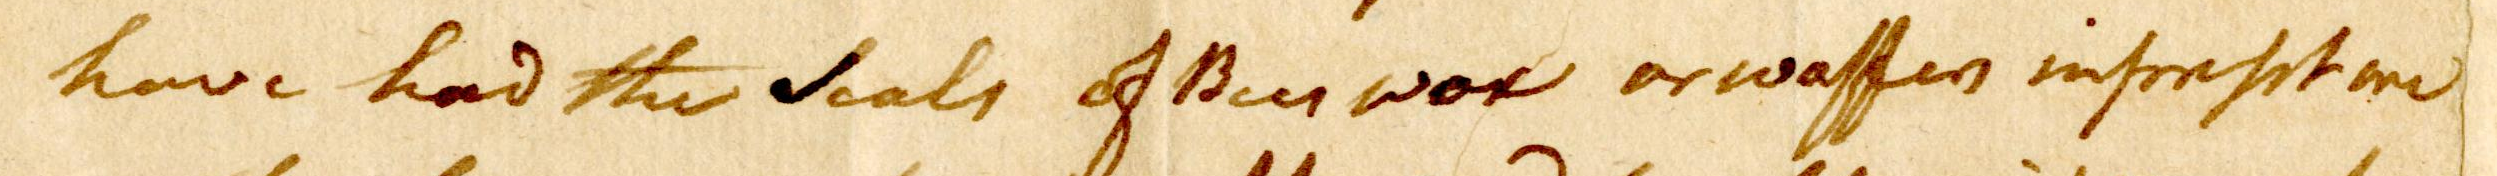have had the Seals of Bees wax or waffers in front are
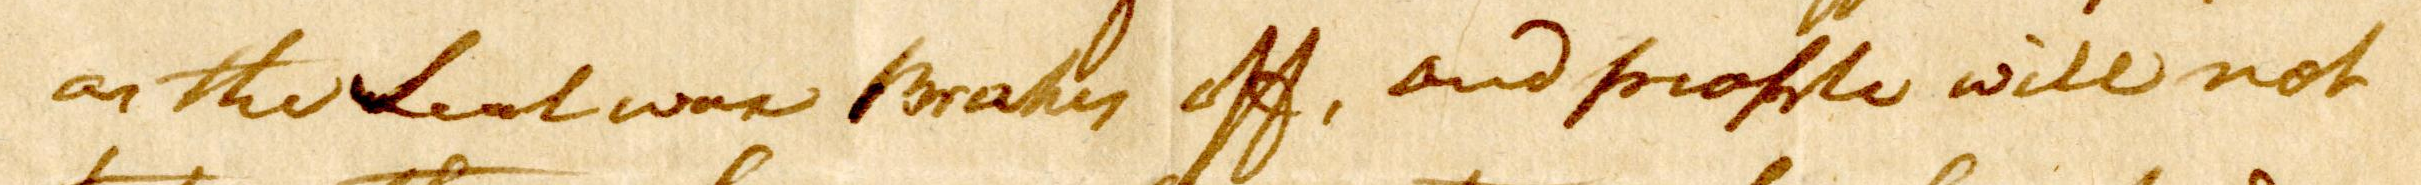as the Seal was Brakes off, and people will not
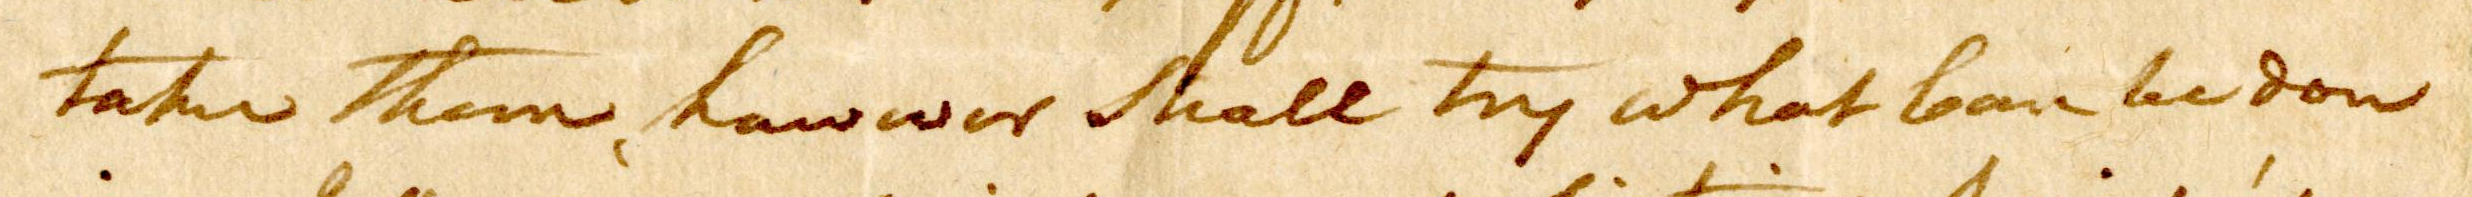take them, however shall try what can be done
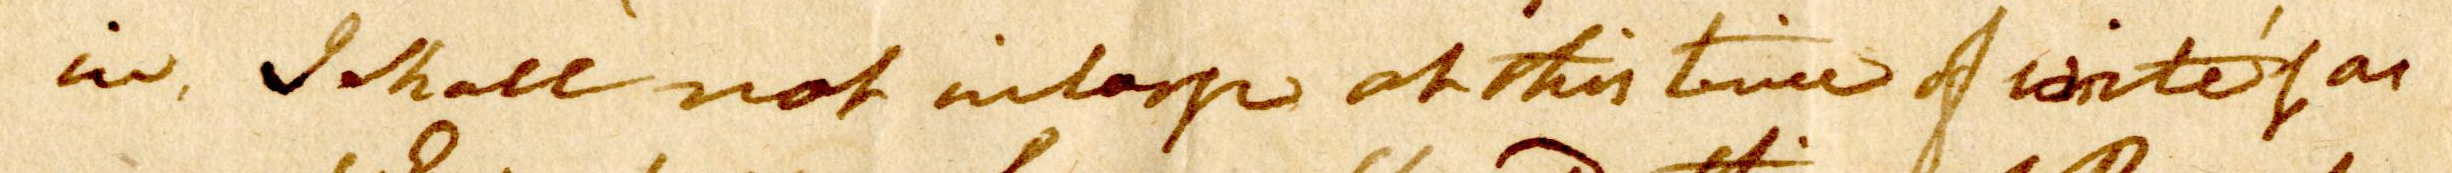in. I shall not interp at this time of writing as
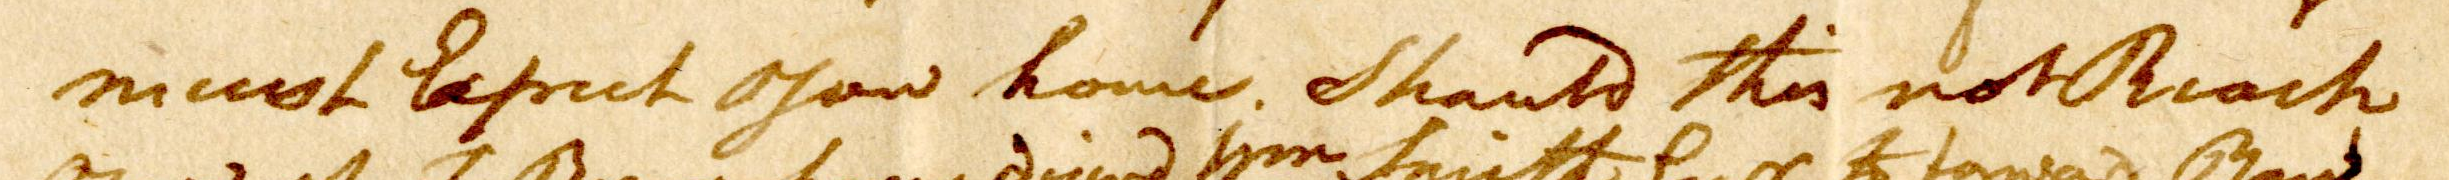must Expect you home. Should this not Reach
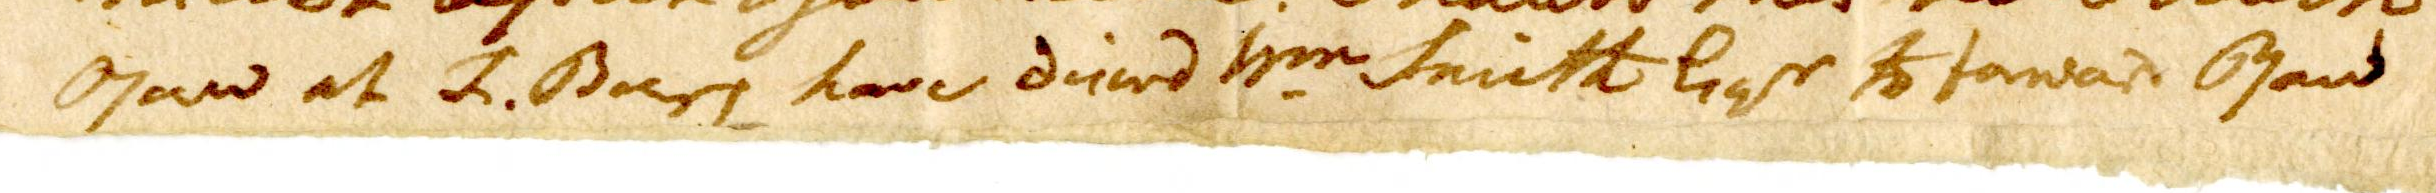you at F. Burg have desir'd W^m Smith Esq^r to forward you
